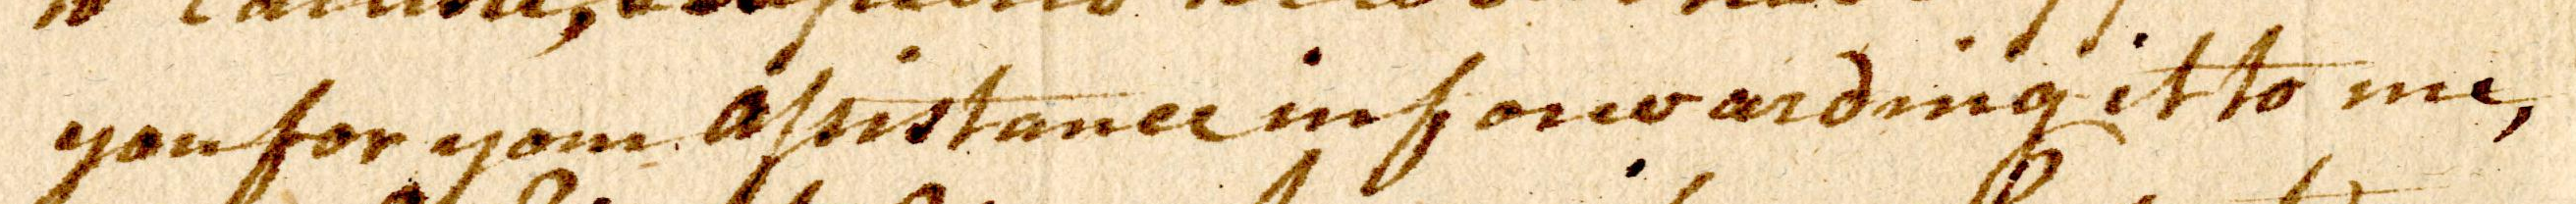you for your assistance in forwarding it to me,
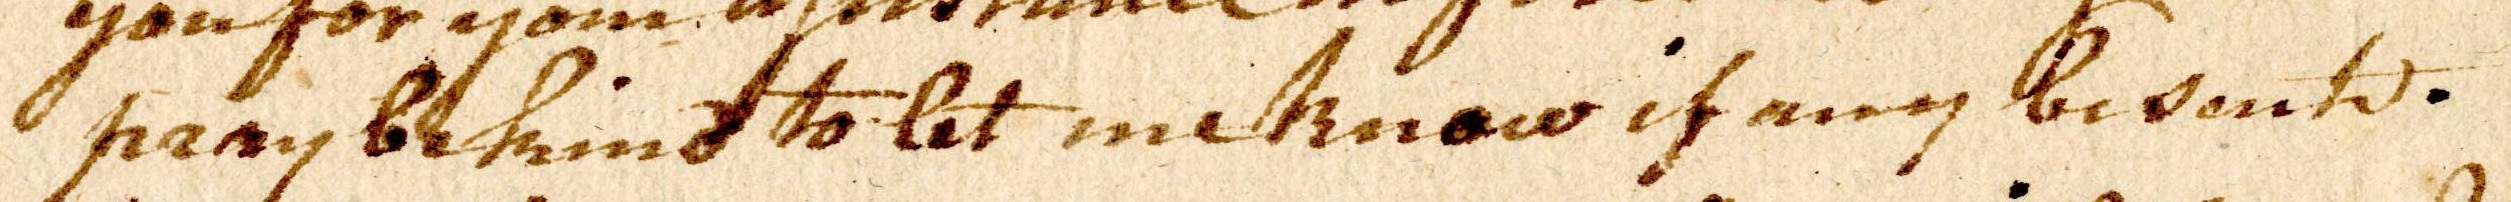pray be kind to let me know if any be sent.
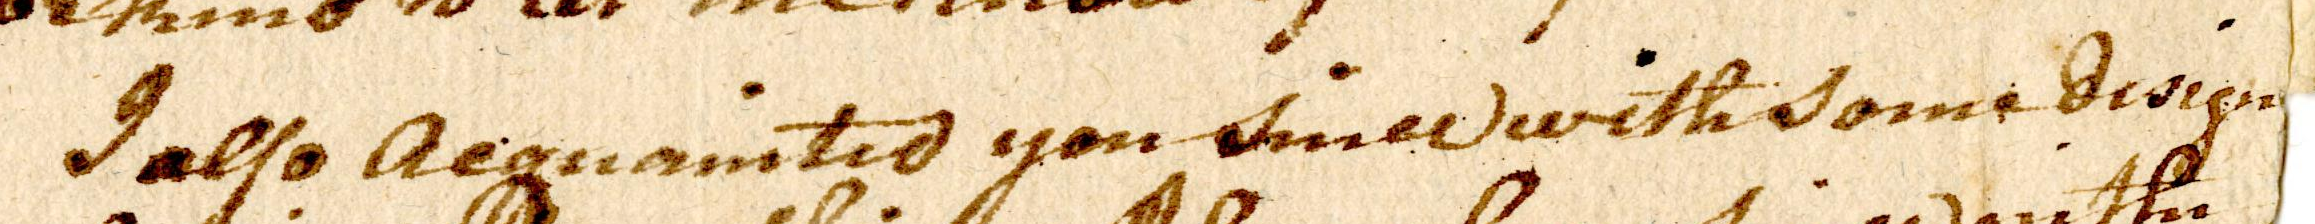I also acquainted you since with some design
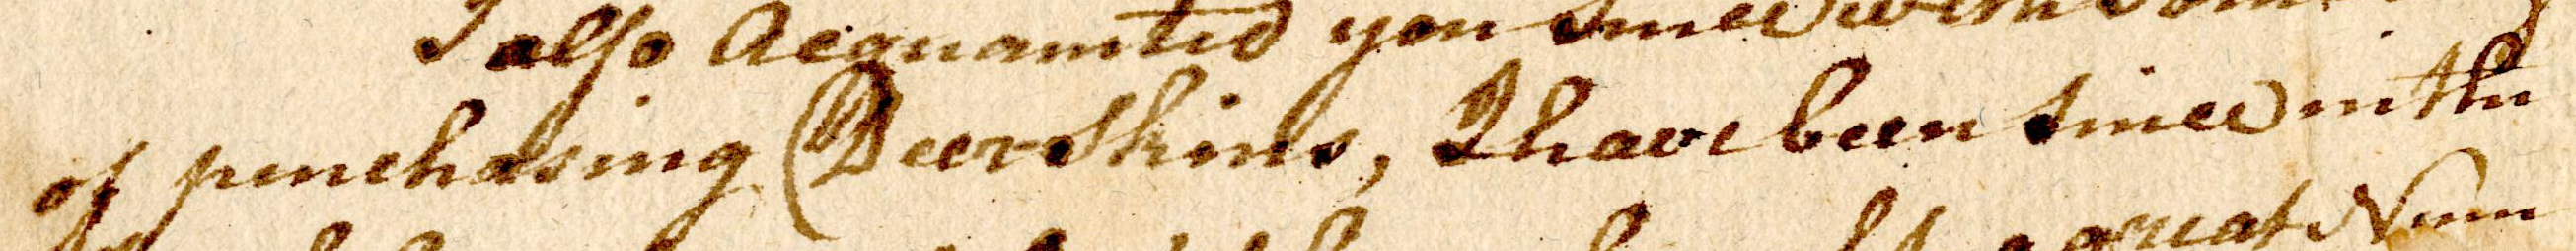of purchasing Deer Skins. I have been since in the
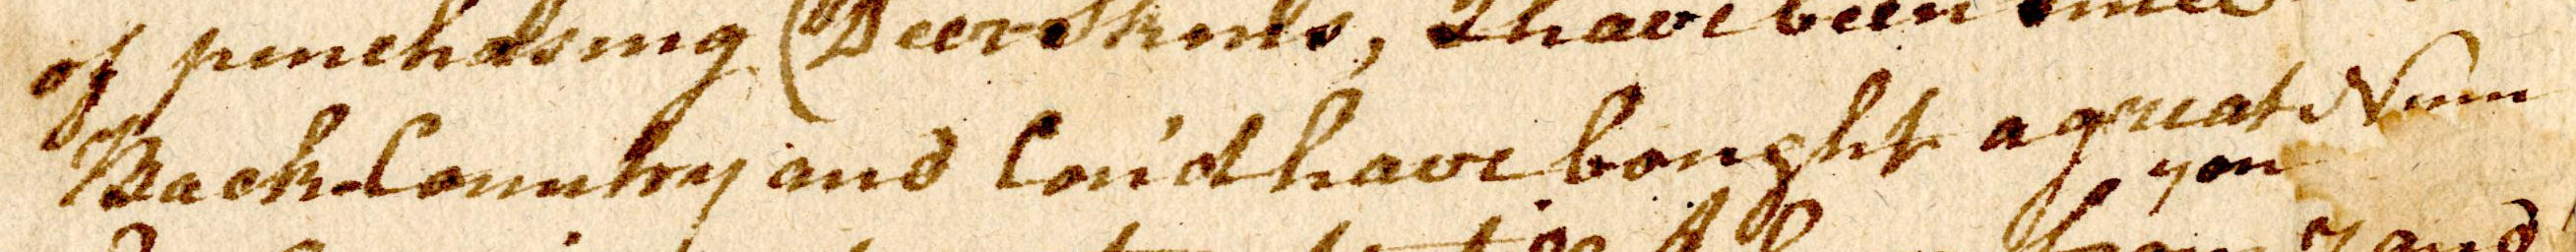Back Country and cou'd have bought a great Num
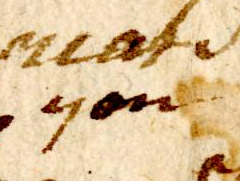you
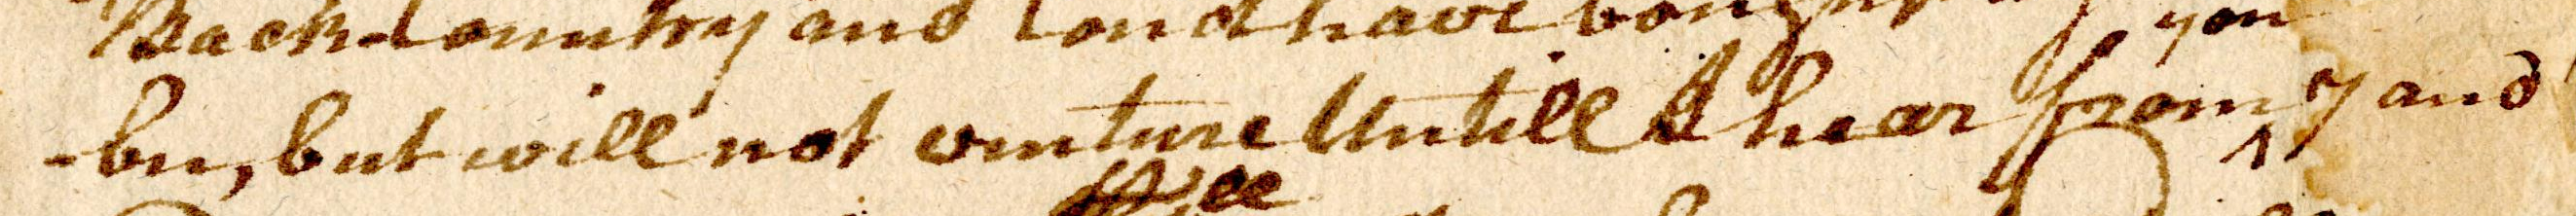-ber, but will not continue untill I hear from ^ 7 and
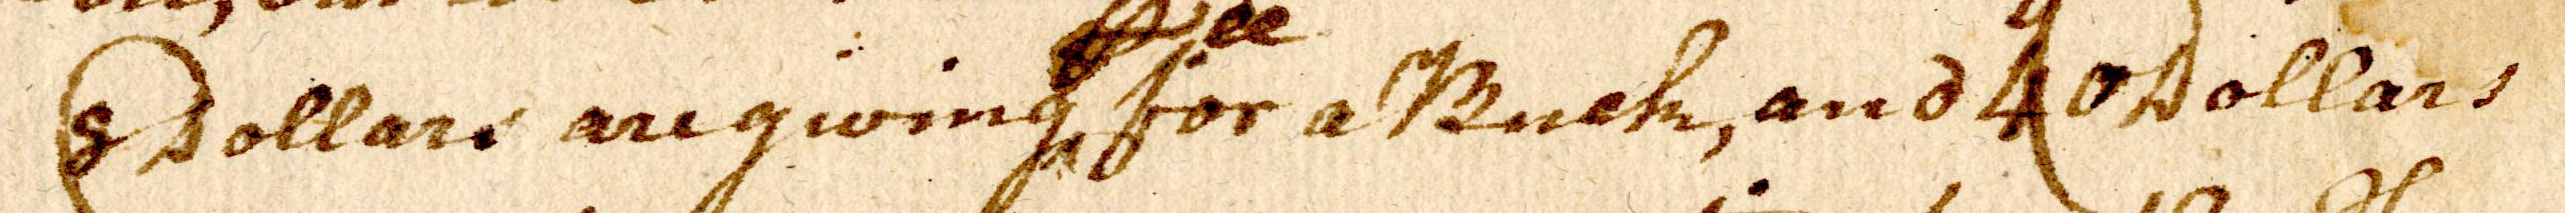8 Dollars are giving ^ for a Buch, and 40 dollars
